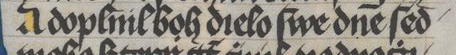A doplnil boh dielo ſwe dne ſéd¬
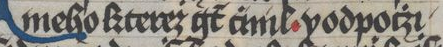meho ktereż ḡt ċíníl.yodpoċzi¬
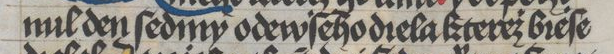nul den ſedmy odewẛeho diela kterež bieẛe
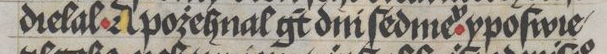dielal. A pożehnal ḡt dní ſedmev.ypoſwie¬
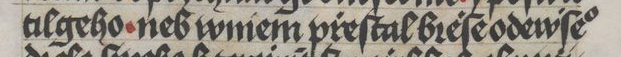til geho.neb wníem pṙeſtal bieẛe odewẛeo
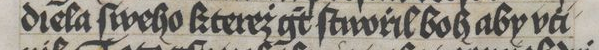diela ſweho ktereż ḡt ſtwoṙil boh aby vċí¬
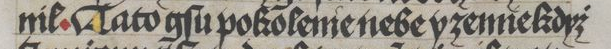níl.Tato gſu pokolenie nebe y zemíe kdyż
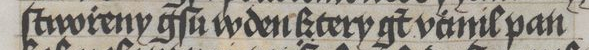ſtwoṙeny gſu w den který ḡt vċiníl pan
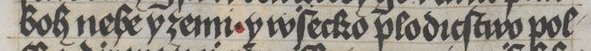boh nebe y zemi.y wẛecko plodicſtwo pol¬
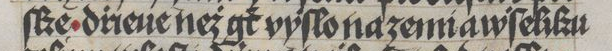ſke. dṙiue neż ḡt vyẛlo na zemí a wẛeliku
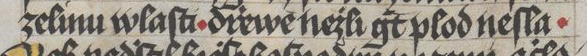zelinu wlaſtí.dṙewé neżli ḡt plod neſla.
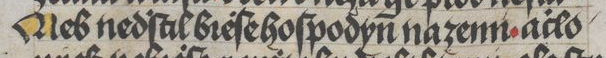Neb nedẛtil bieẛe hoſpodyn na zemí. aċlo¬
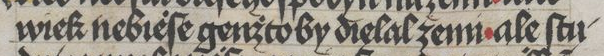wiek nebieẛe genżto by dielal zemí.ale ſtu¬
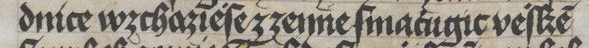dníce wzchazieẛe z zemie ſinaċugíc veẛkē
